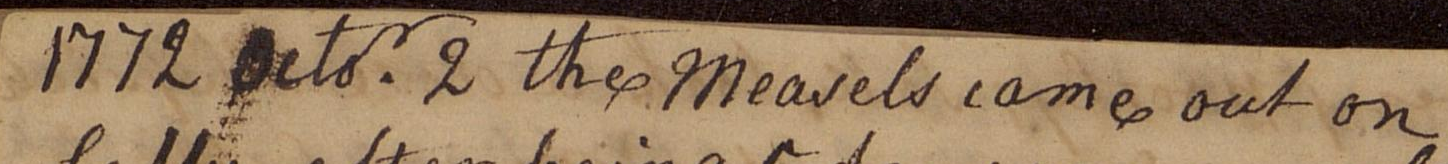1772 Octo^r. 2 the Measels came out on
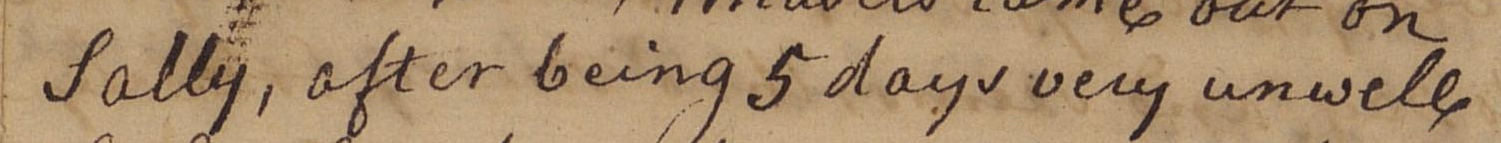Sally, after being 5 days very unwell
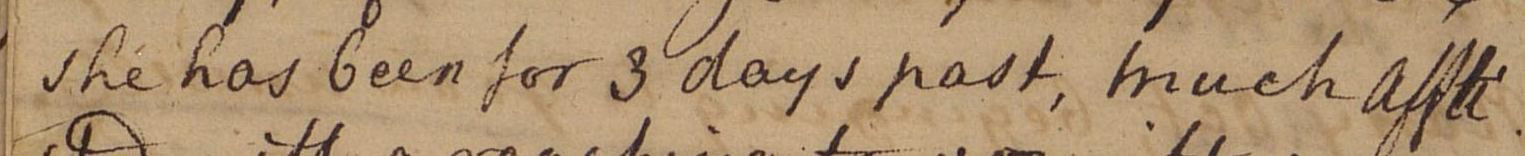she has been for 3 days past, much Affti
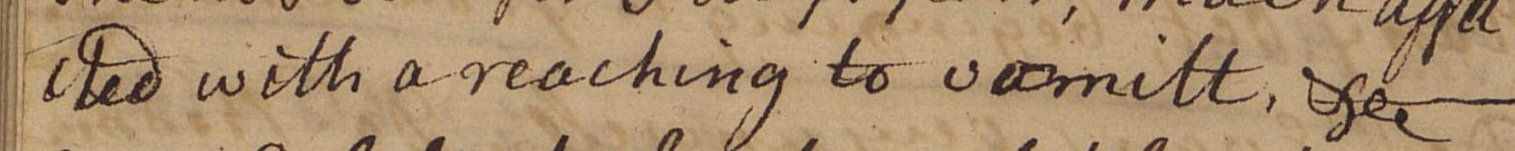cted with a reaching to vomitt, &c.-
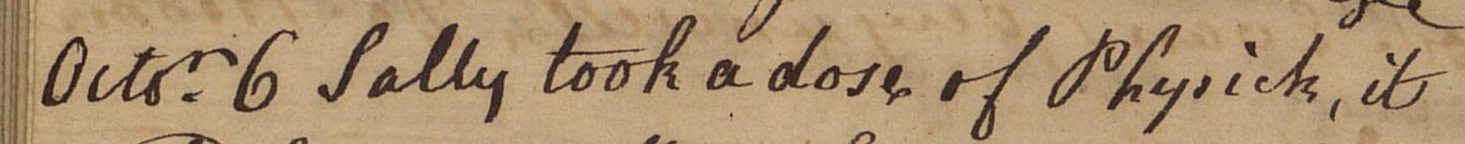Octo^r. 6 Sally took a dose of Physick, it
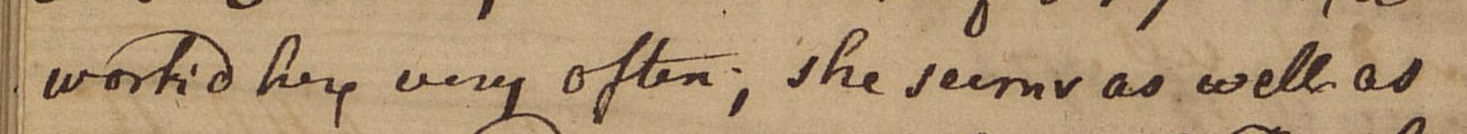work'd here very often, she seems as well as
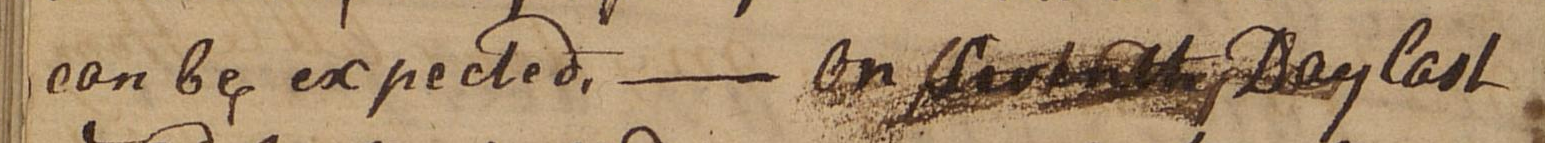can be expected.- on [Seventh] Day last
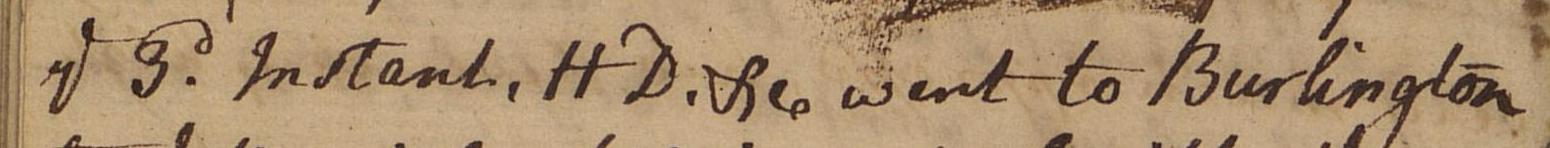y^e 3^d. Instant, HD. & c went to Burlington
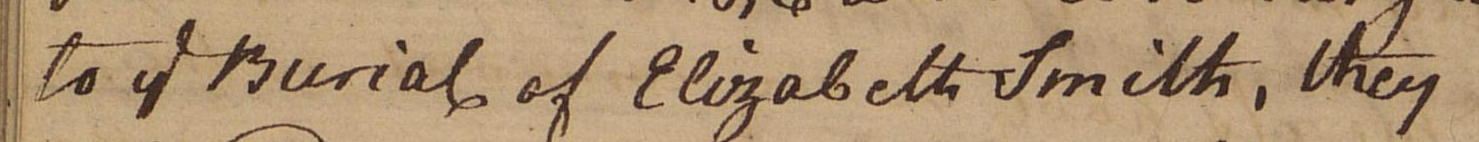to y^e Burial of Elizabeth Smith, they
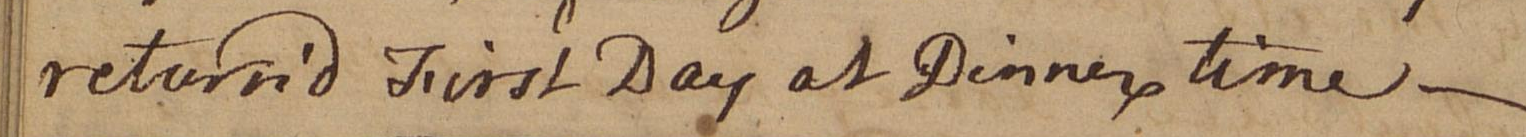return'd First Day at Dinner time-
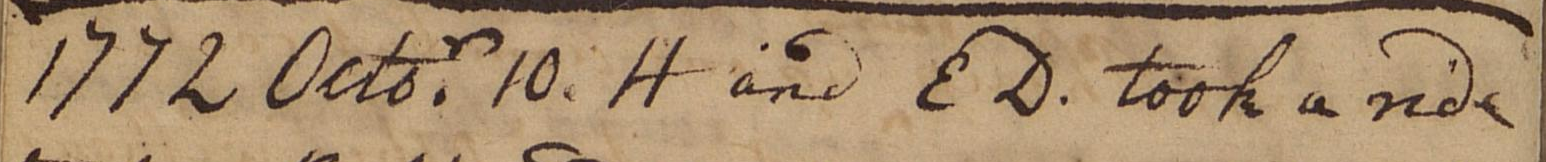1772 Octo^r. 10. H and ED. took a ride
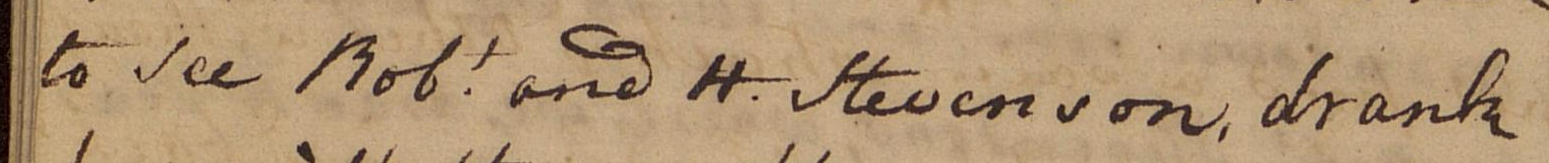to see Rob^t. and H. Stevenson, drank
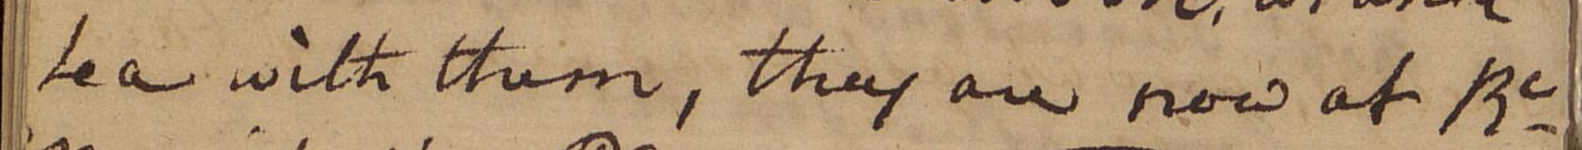tea with them, they are now at R^c
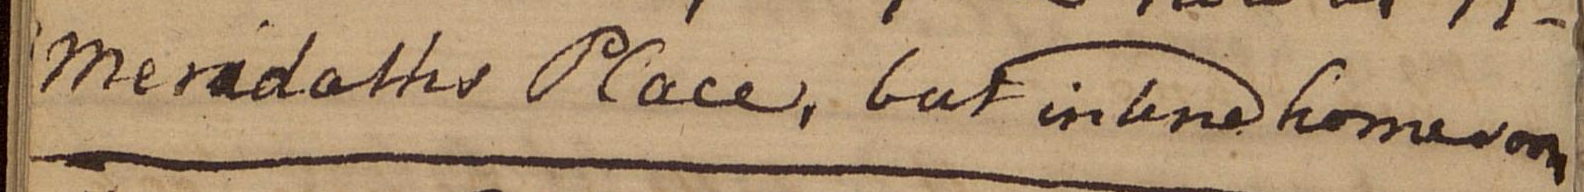Meridaths Place, but intend home [soon]
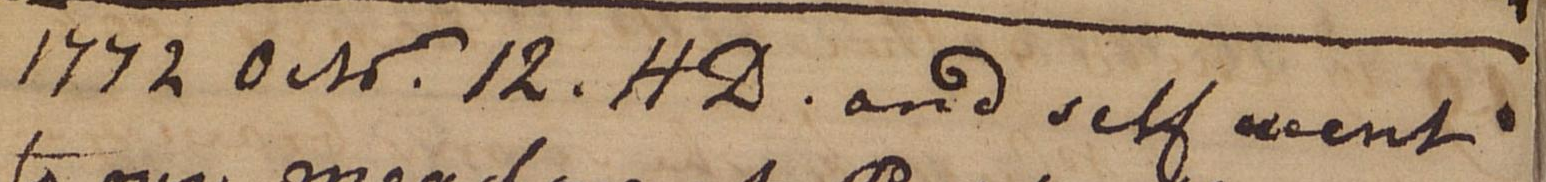1772 Octo^r. 12. HD. and self went
